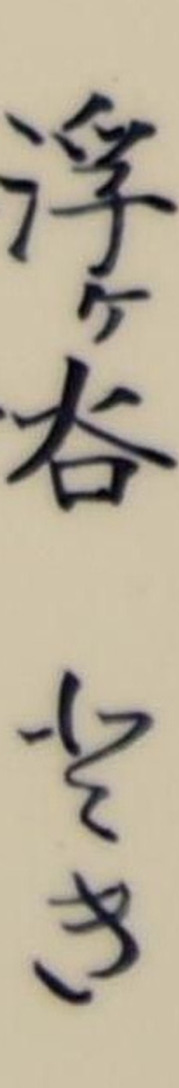浮ヶ谷とき
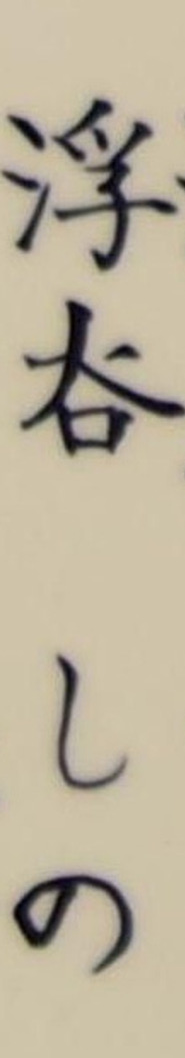浮谷しの
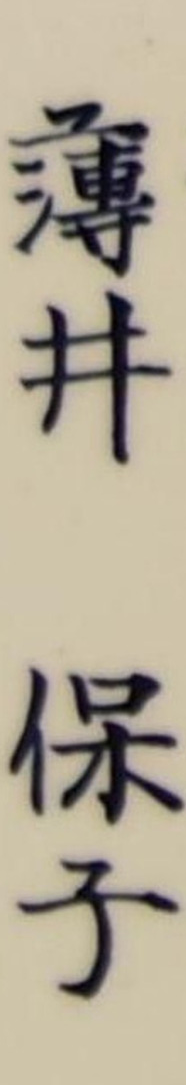薄井保子
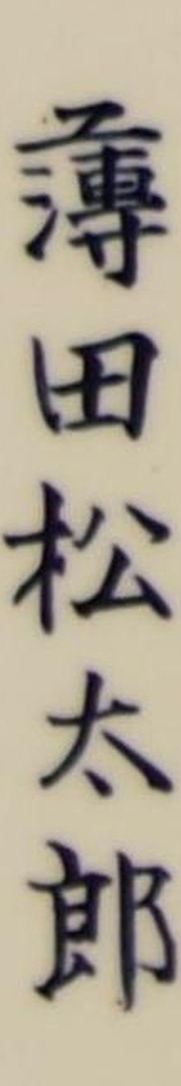薄田松太郎
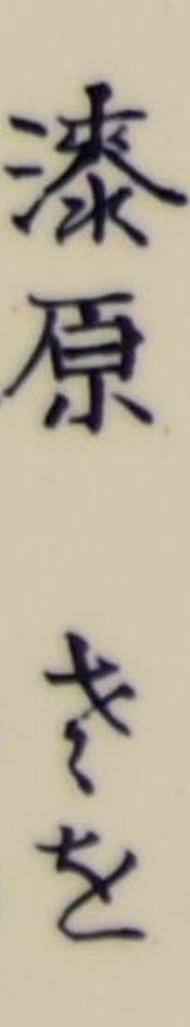漆原さを
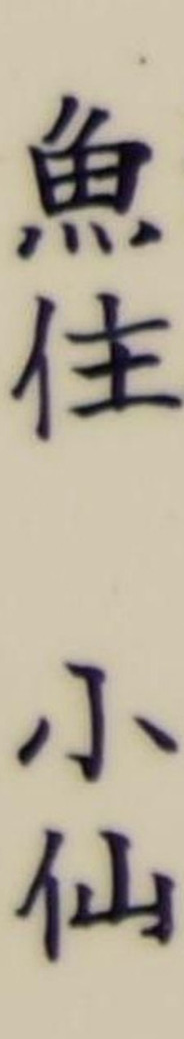魚住小仙
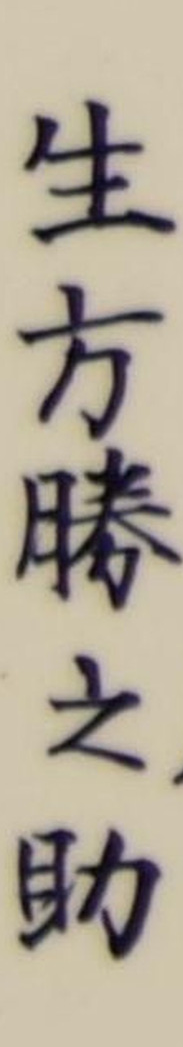生方勝之助

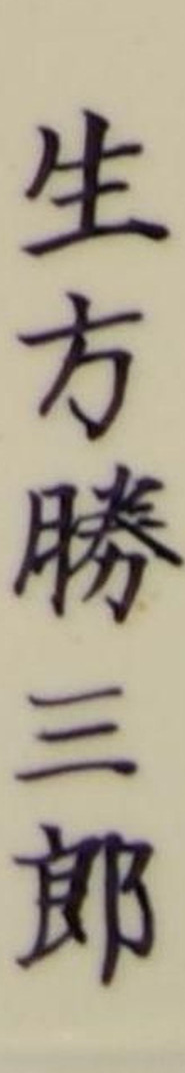生方勝三郎
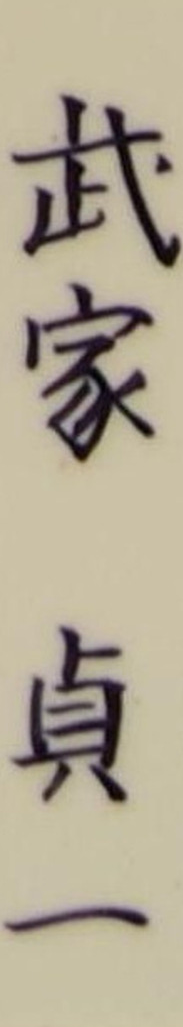武家貞一
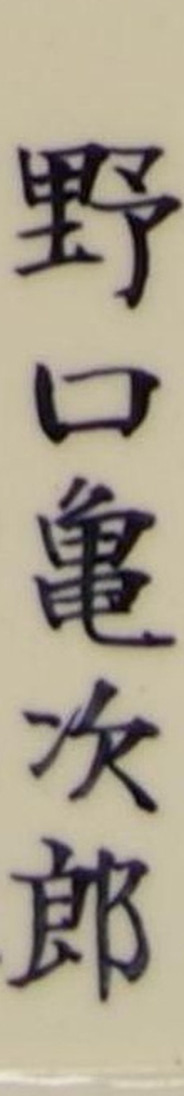野口亀次郎
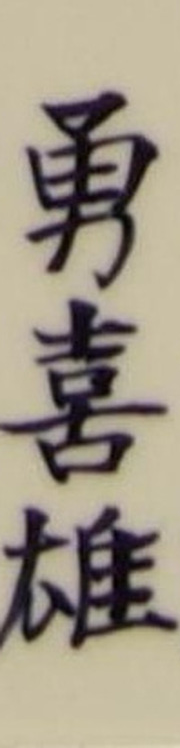勇喜雄
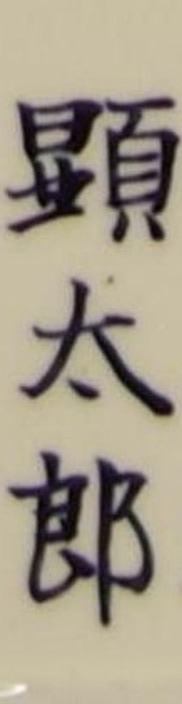顕太郎
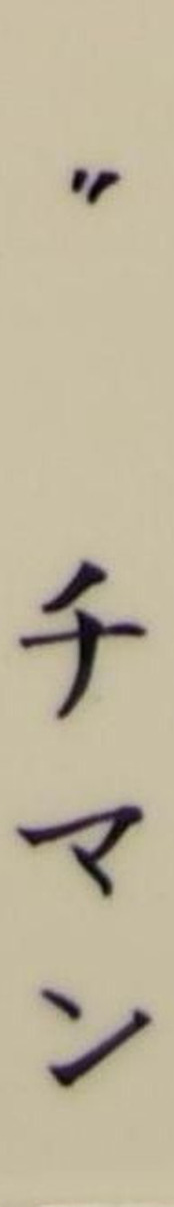チマン
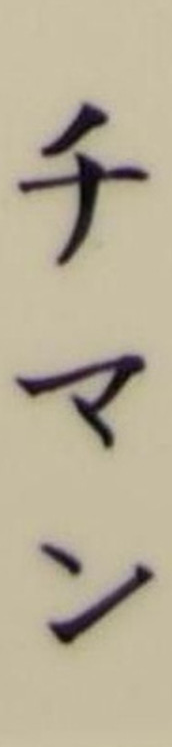チマン
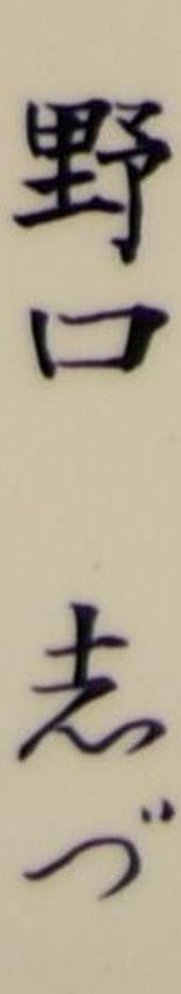野口しづ
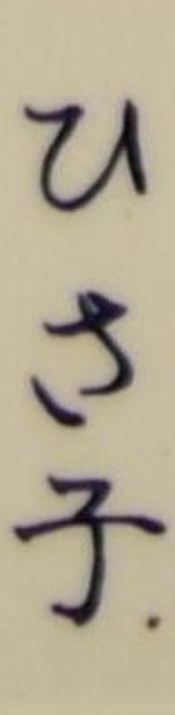ひさ子
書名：A~D
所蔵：koyasan kongobuji
